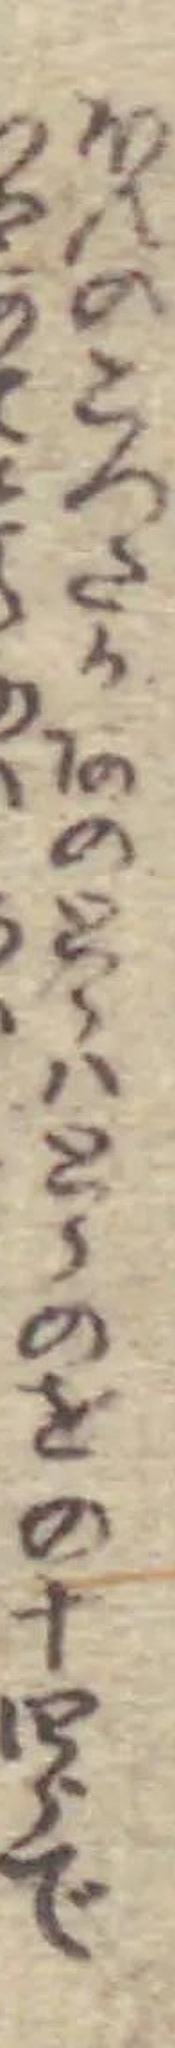ほんのこつたかあのとらはとらのをの十四郎で
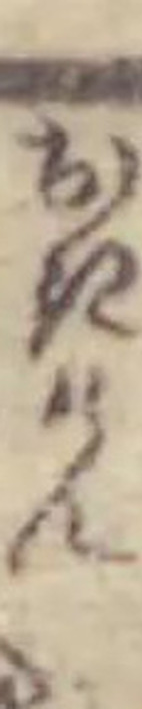おきけん
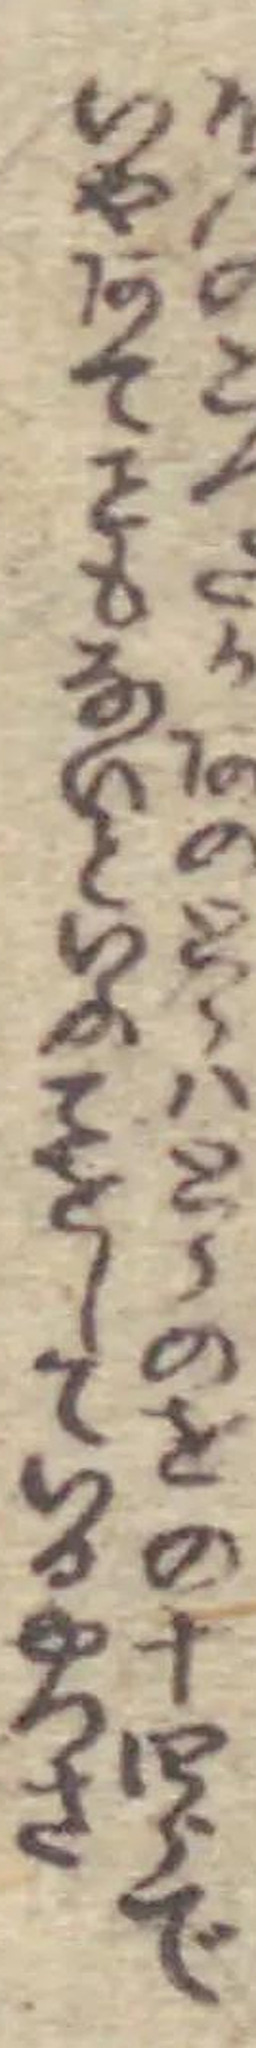いやあてこともないといふてをしているやつさ
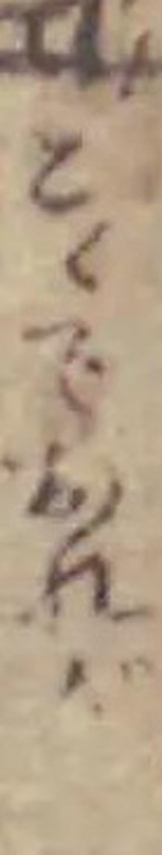こゝでおれが
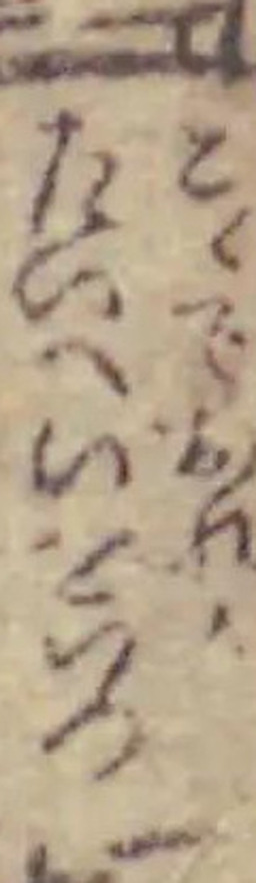たいへいをいつ
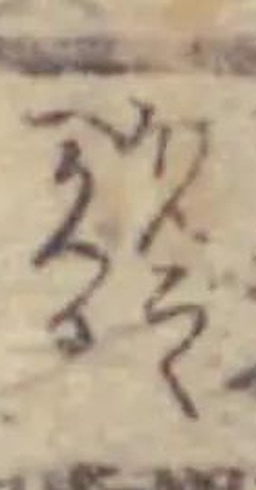へかへる
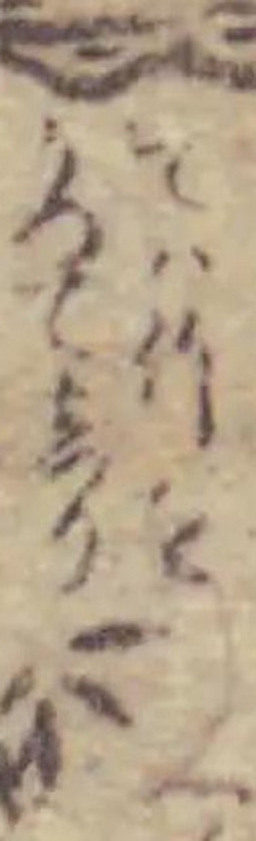かつてしり
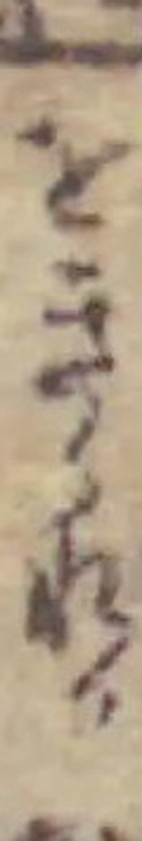をきられる
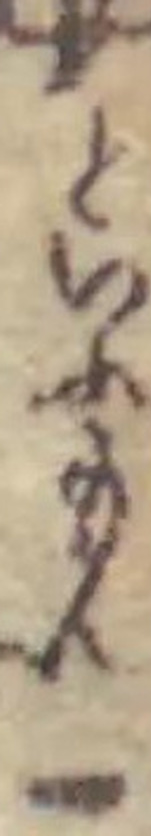といふもん
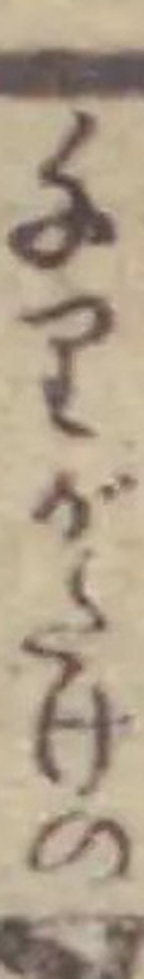千里がたけの
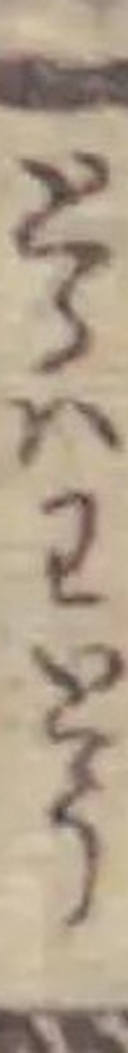とらはわとう
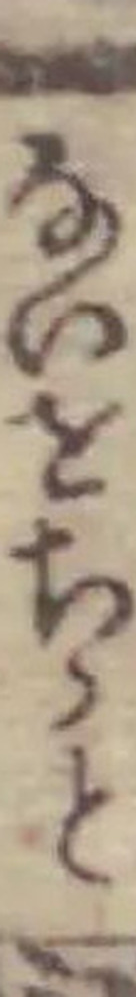ないをちらと
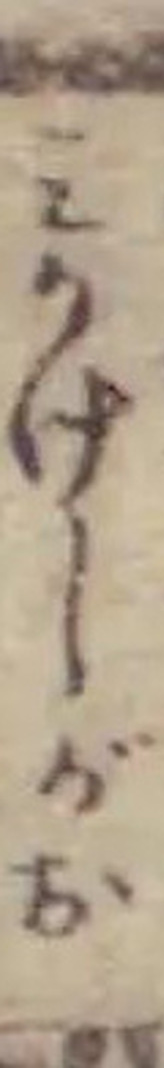みかけしがお
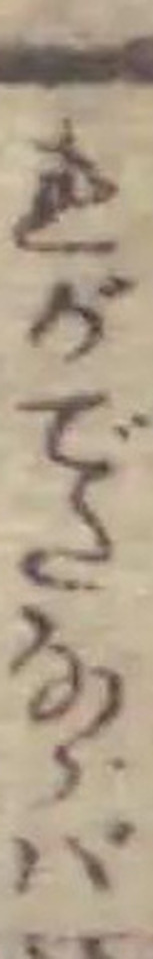れがでたならば
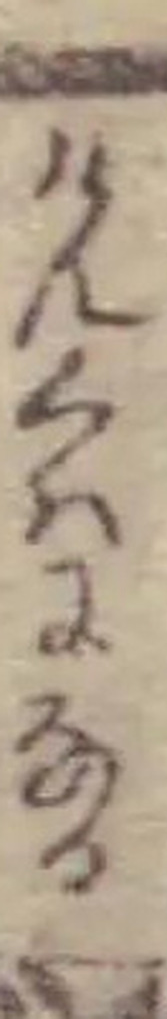けんくはになる
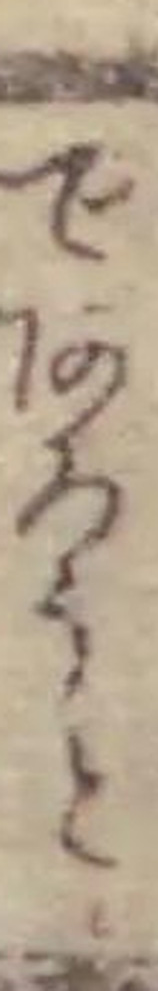であろうと
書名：茶羅毛通人 3巻
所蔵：国立国会図書館 National Diet Library, JAPAN
